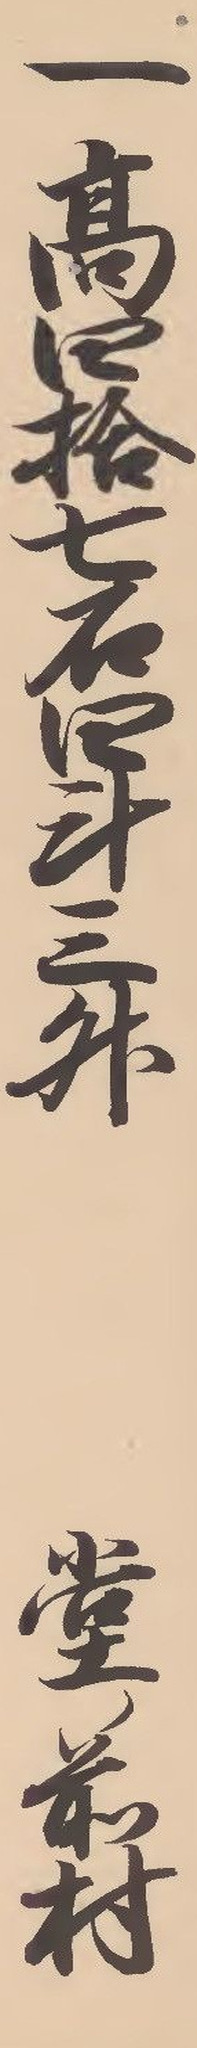一高四拾七石四斗三升堂ノ前村
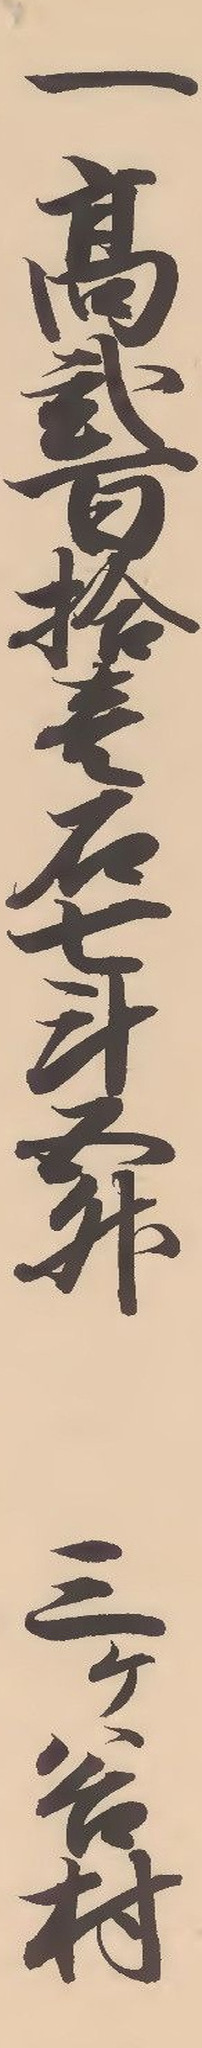一高弐百拾壱石七斗五升三ヶ谷村
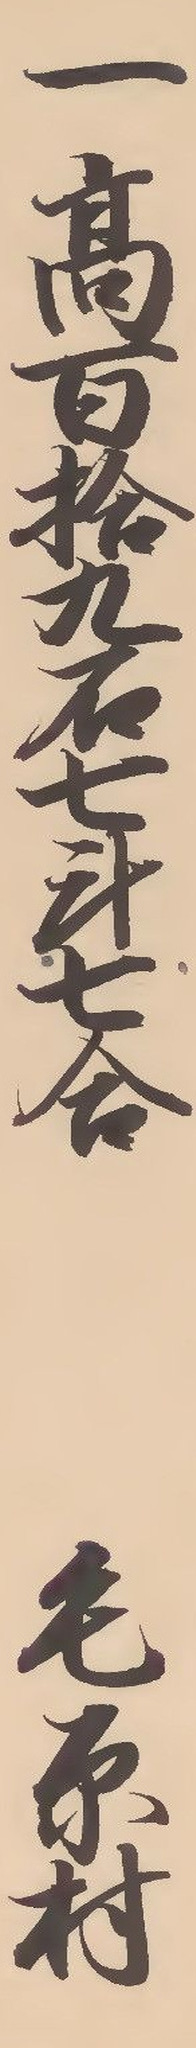一高百拾九石七斗七合毛原村

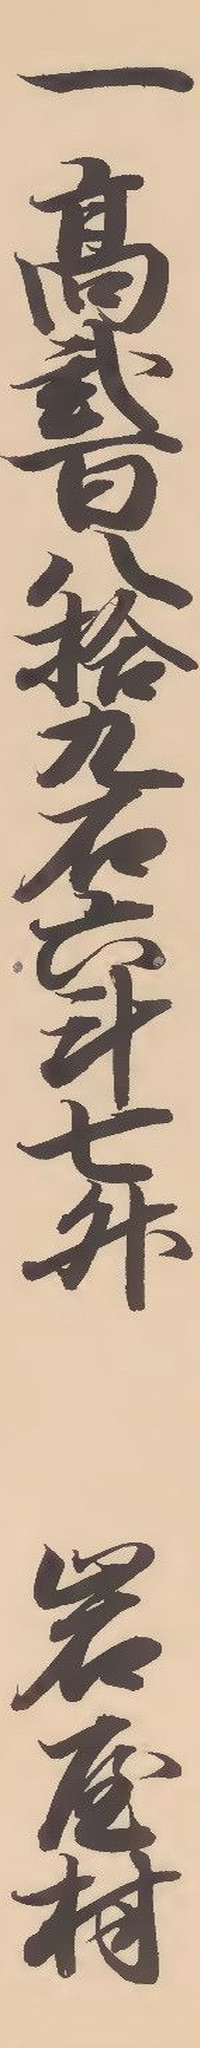一高弐百八拾九石六斗七升岩屋村
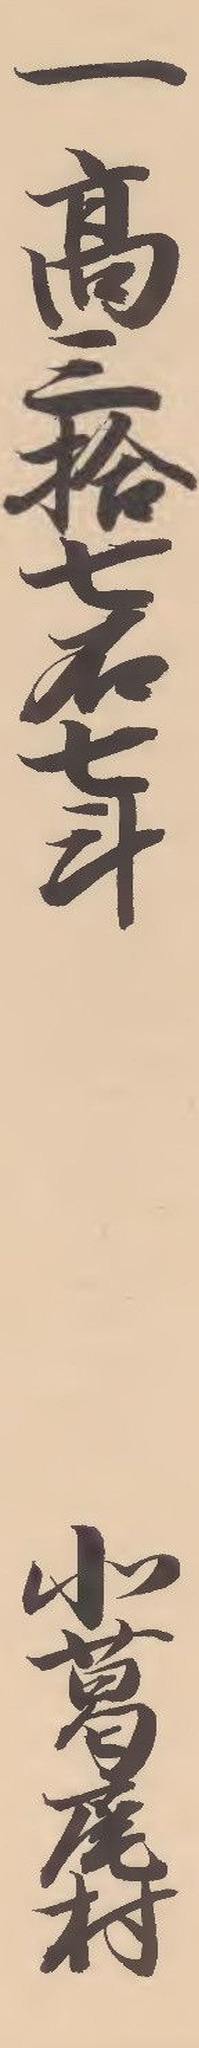一高三拾七石七斗北葛尾村
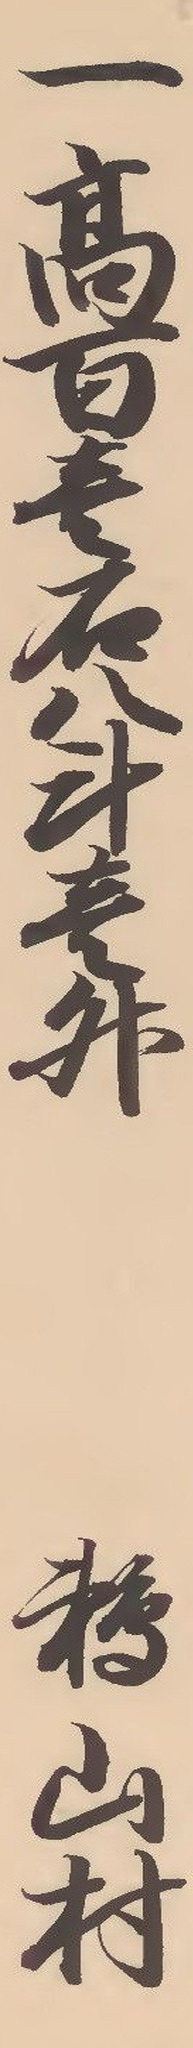一高百壱石八斗壱升鵜山村
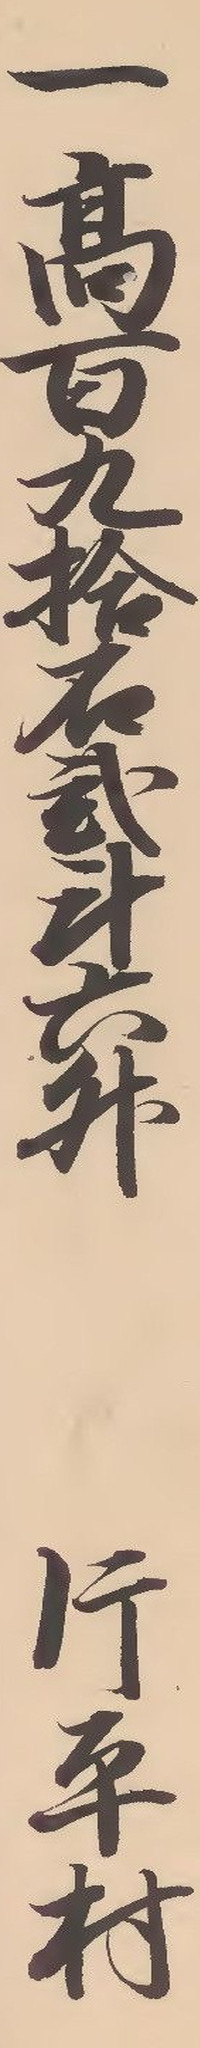一高百九拾石弐斗六升片平村
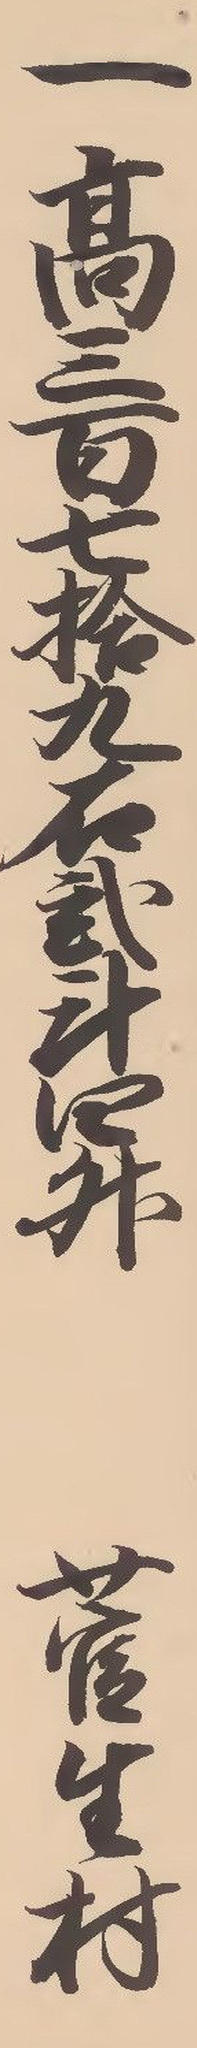一高三百七拾九石弐斗四升菅生村
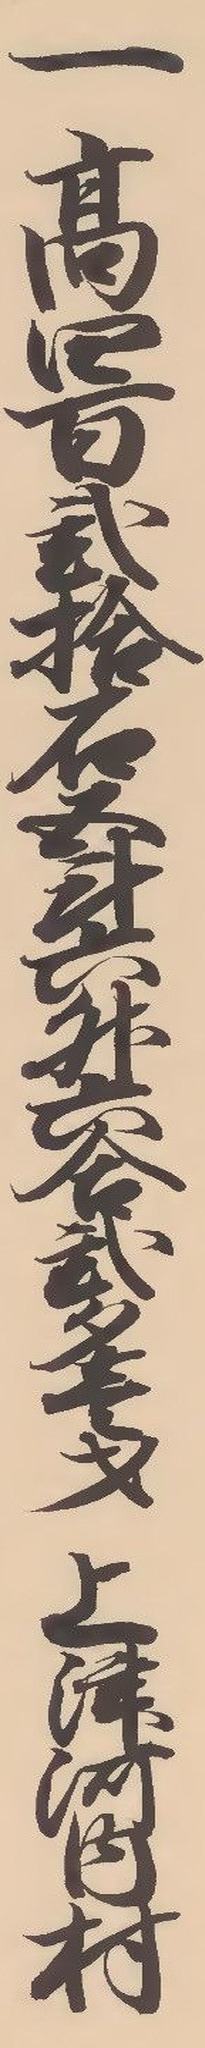一高四百弐拾石五斗六升六合弐勺壱才上津河内村
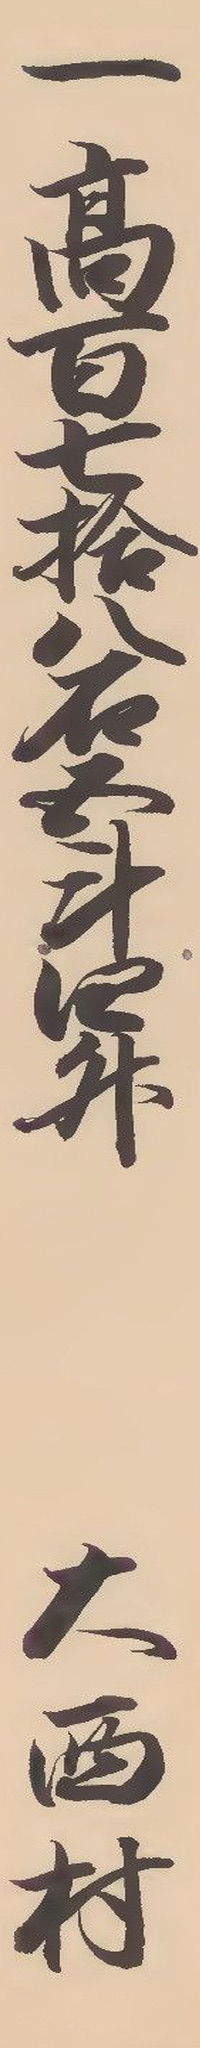一高百七拾八石五斗四升大西村

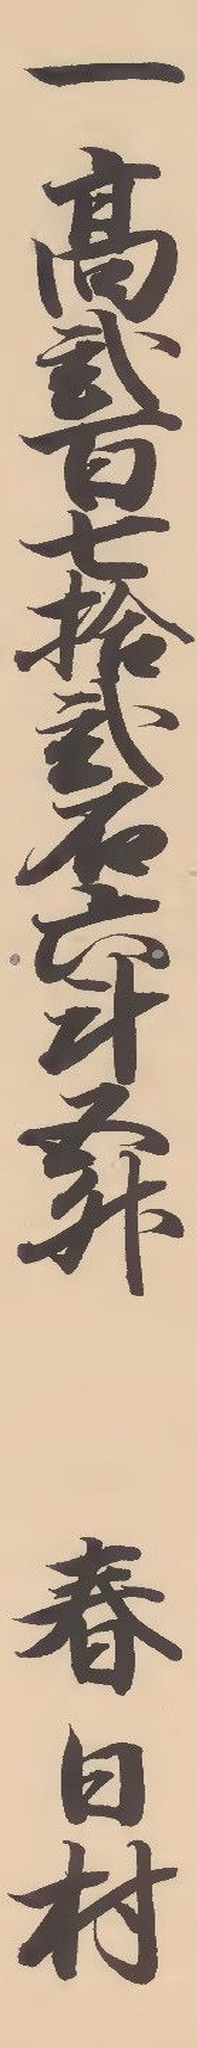一高弐百七拾弐石六斗五升春日村
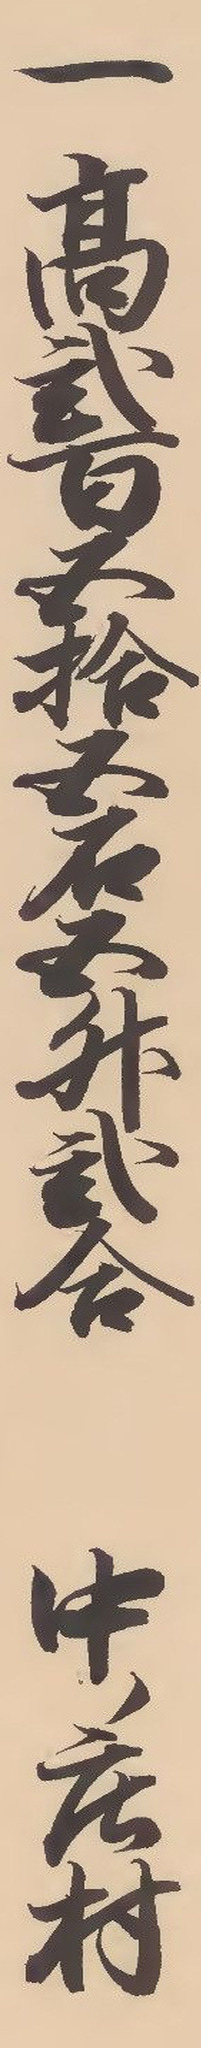一高弐百五拾五石五升弐合中ノ庄村
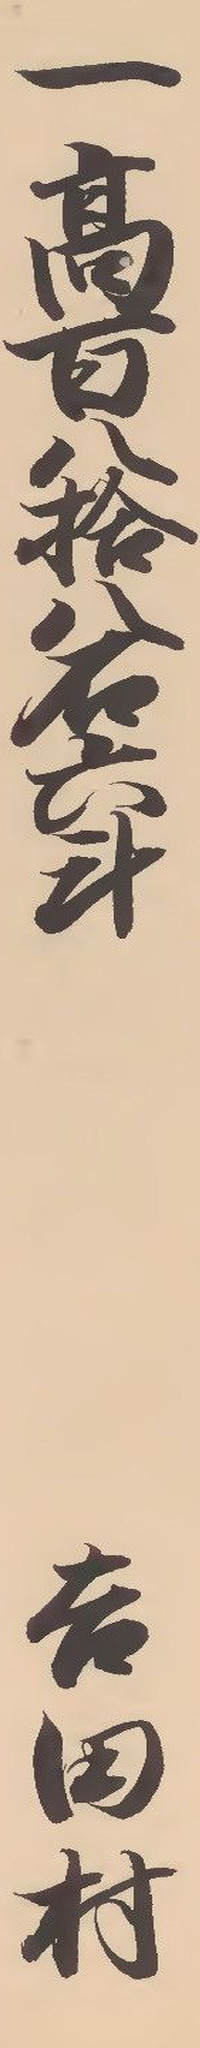一高百八拾八石六斗吉田村
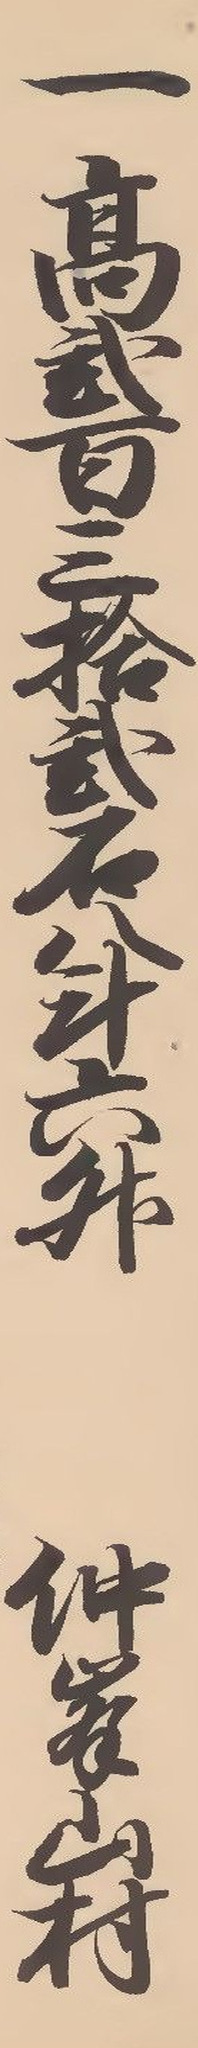一高弐百三拾弐石八斗六升仲峯山村
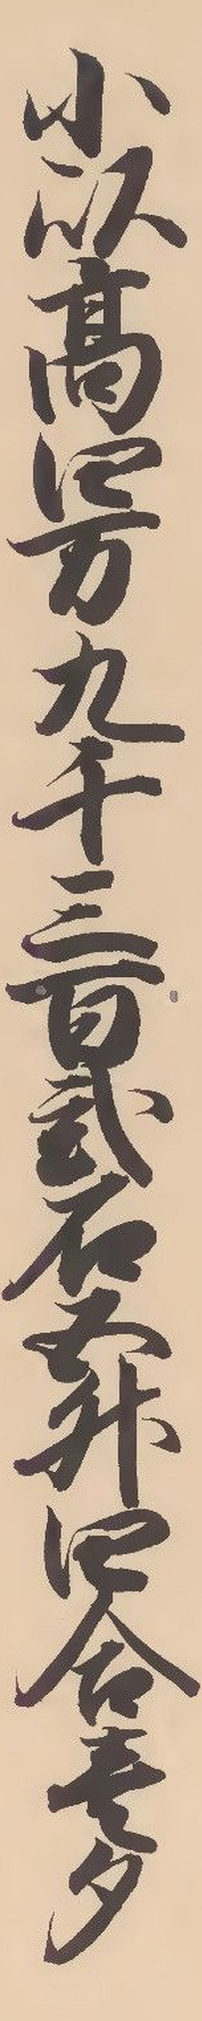小以高四万九千三百弐石五升四合壱勺

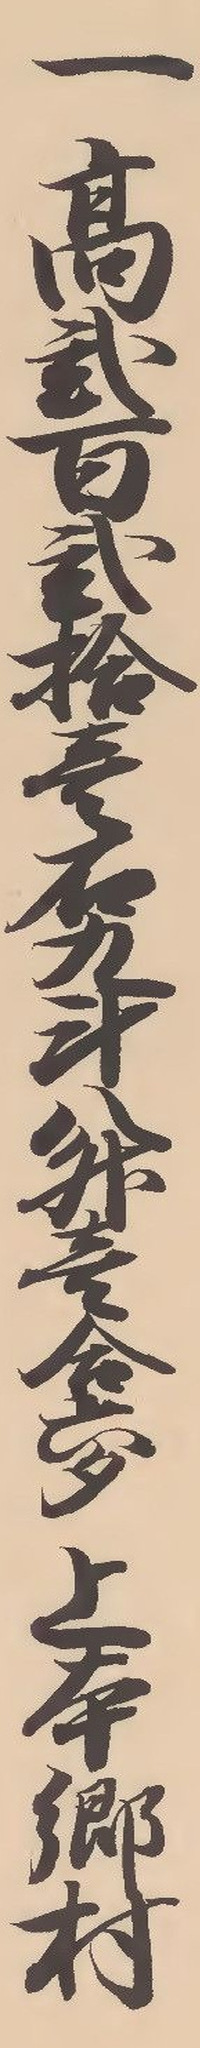一高弐百弐拾壱石九斗八升壱合六勺上本郷村
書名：大和国郷帳
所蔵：国立公文書館 National Archives of Japan
